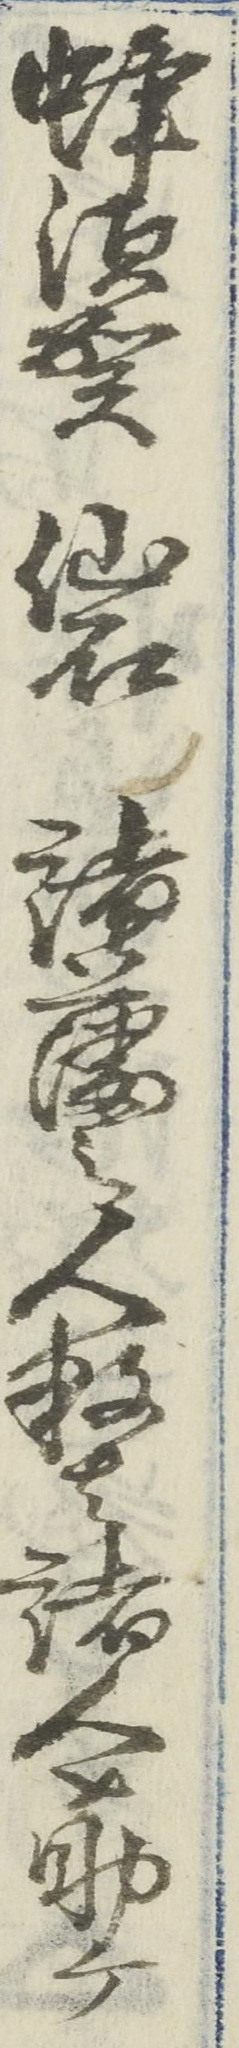蜂須賀仙石諸藩之人数は諸人ヲ助ケ
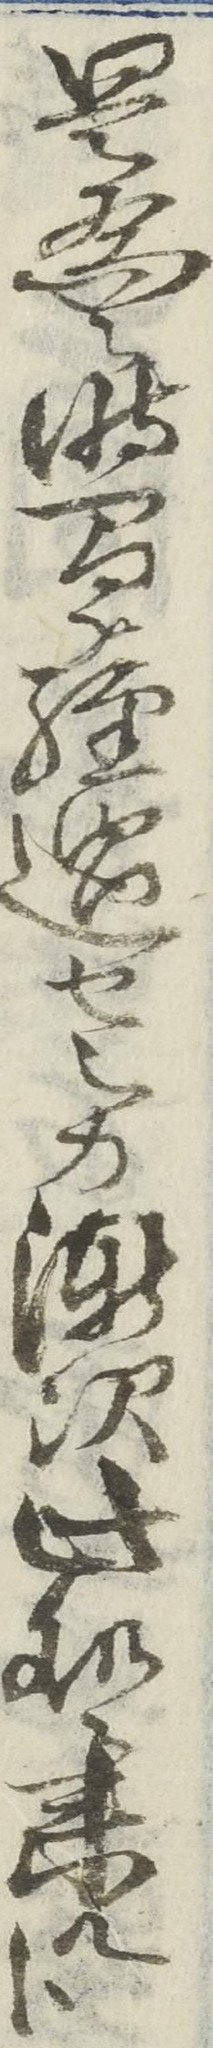是為ニ時間経過セシカ漸次此処来ルト
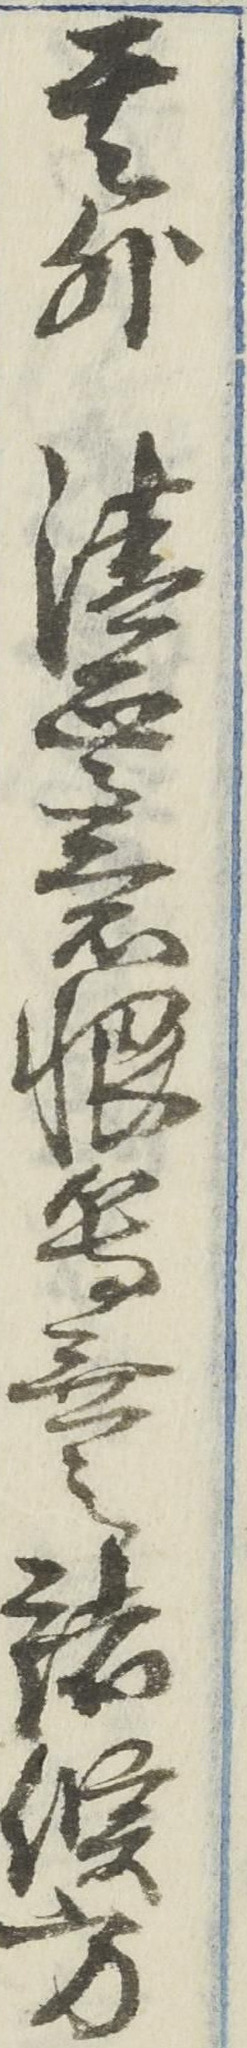其外清正ニ意恨等無之諸侯方
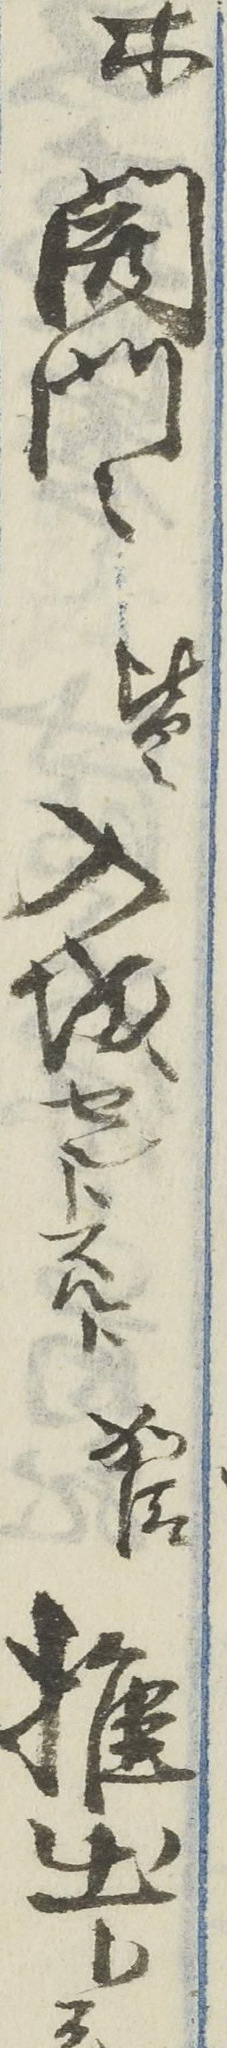木開門〻皆々入城セントスルト加清権出ト云
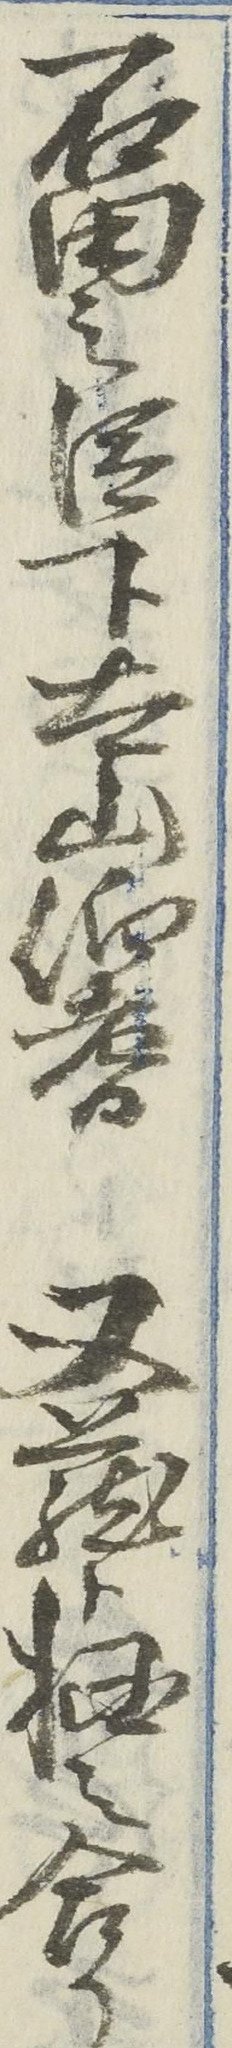石田之臣下太山伯耆又蔵ト摑ミ合う
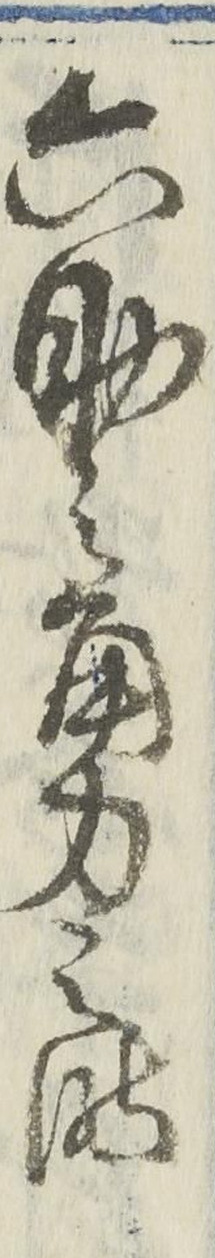六助之角力之時
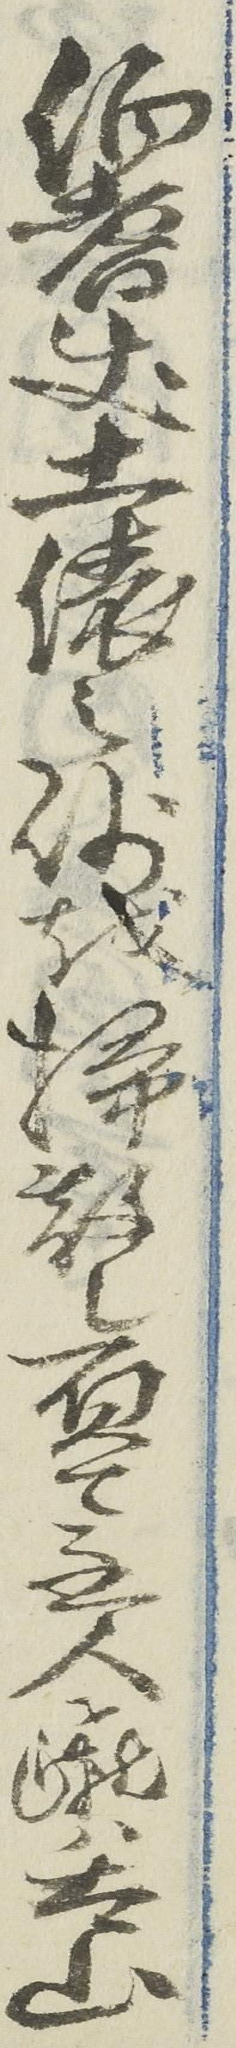伯耆丈土俵之砂を掃散し負て主人ヲ蹴ハ太山
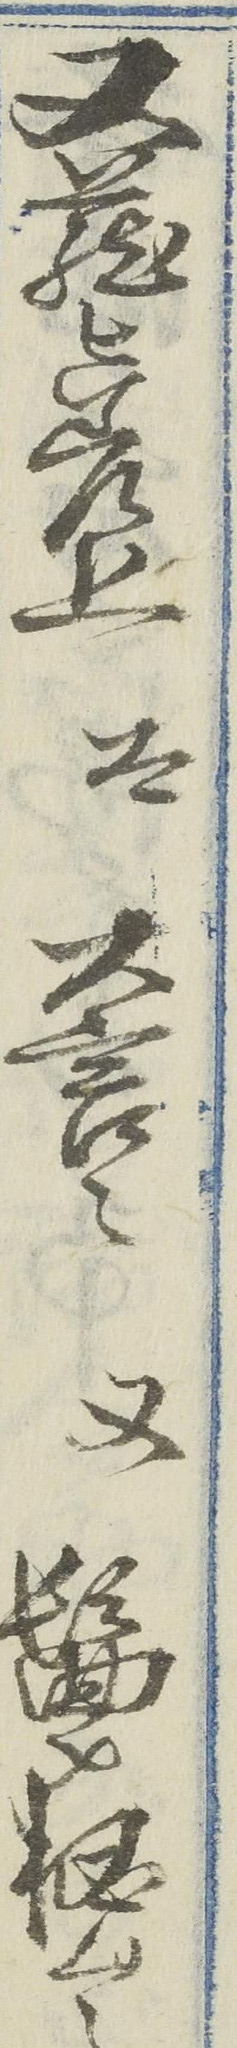又蔵被差上太大言〻又髷ヲ摑ム〻
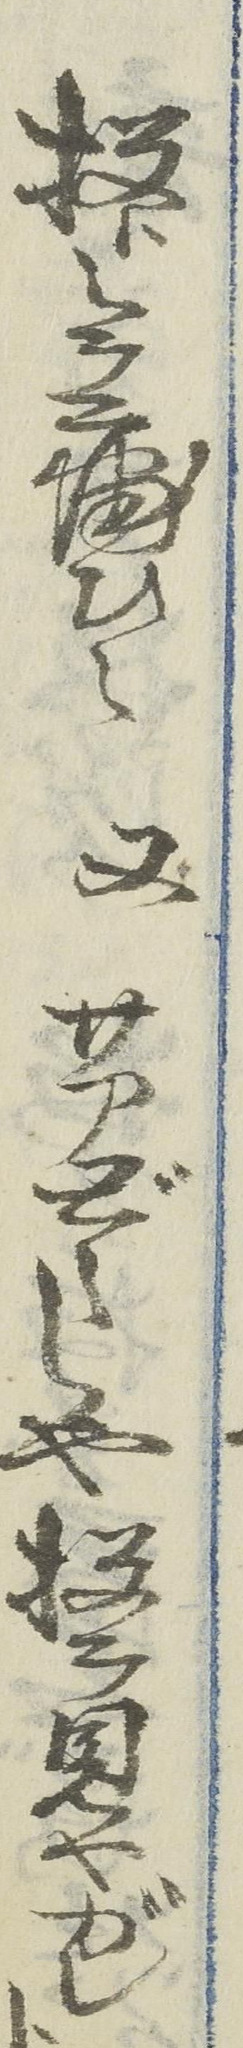太投トシテ痛ひ〻又サアどうしや投テ見ヤガレト

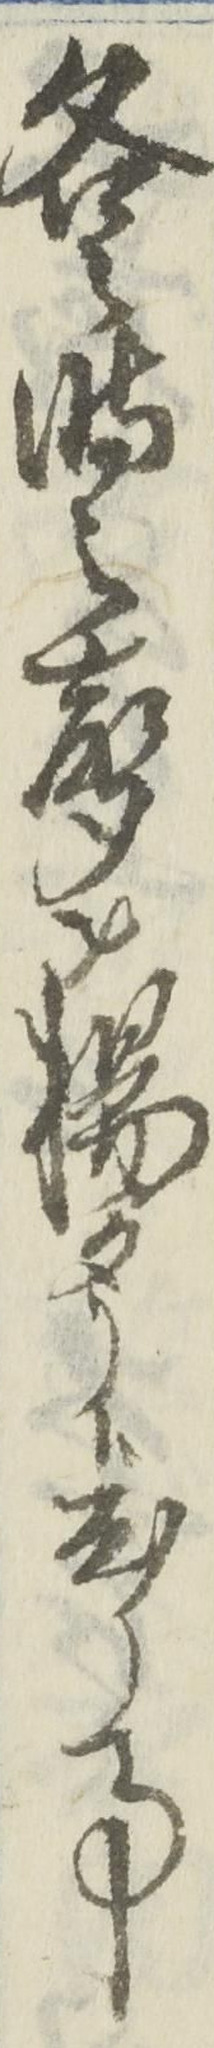各々時之声を揚タリト云う事
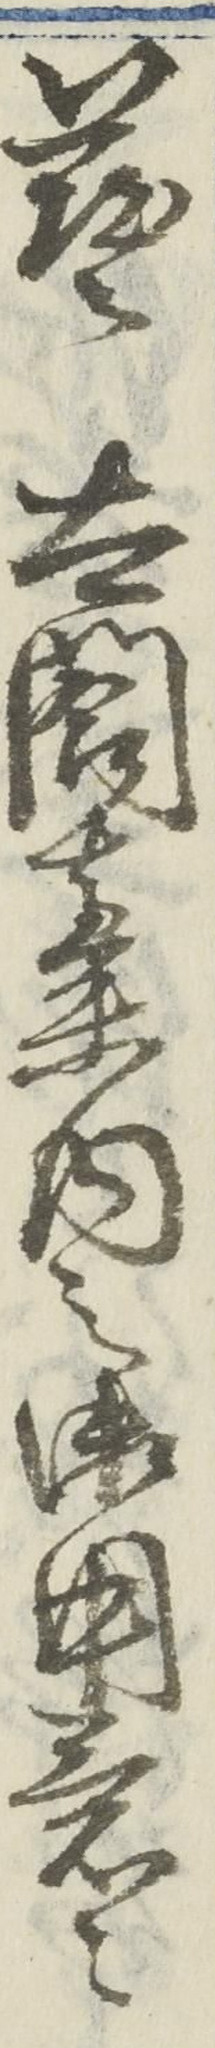茲に太閤は参内之御用意と
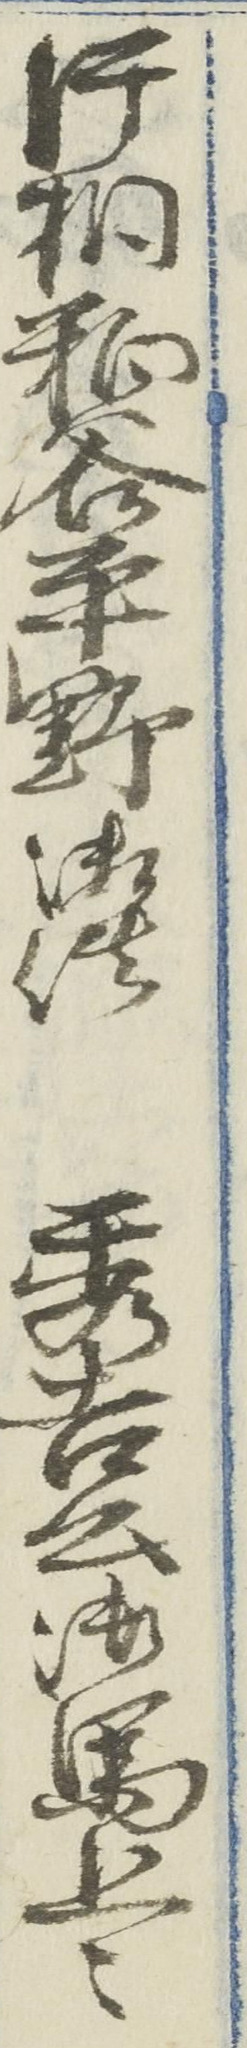片桐粕谷平野御供秀吉公御馬上ニ
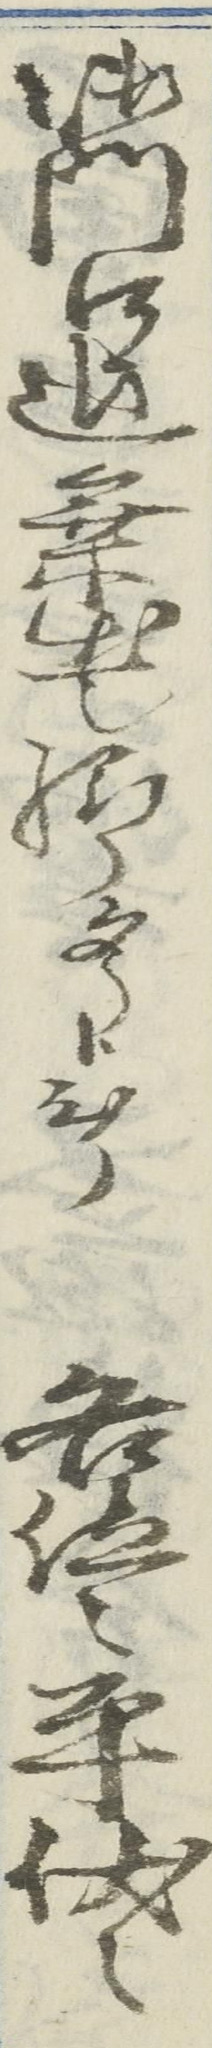御門口迄乗出し給ウたしト云う各位は平伏し
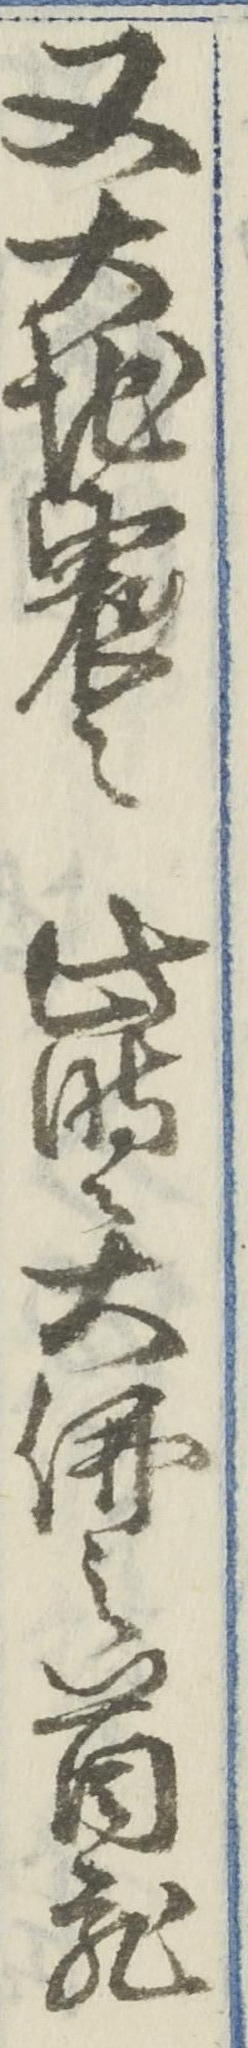又大地震ニ此時之大仏之首就
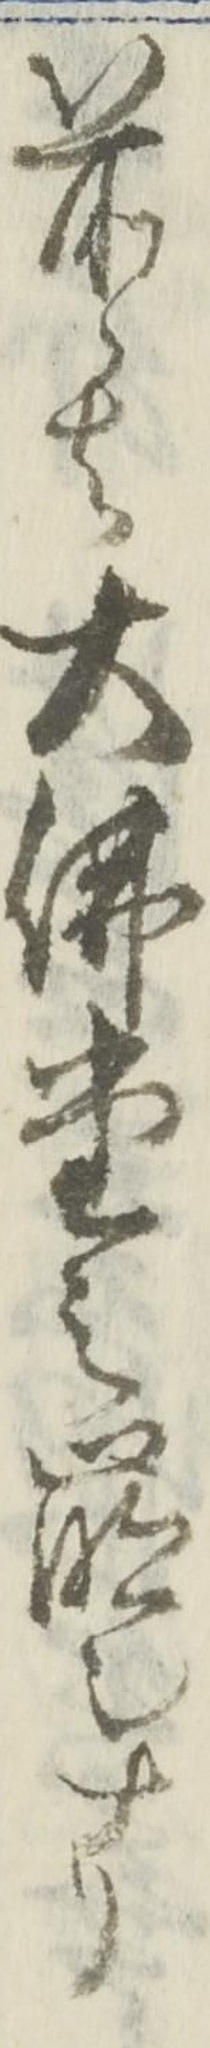前は大仏堂之崩レナリ
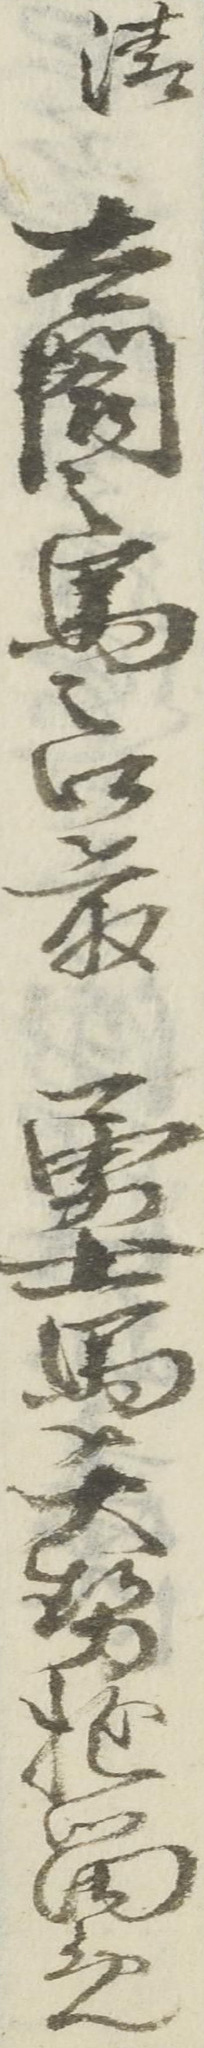清太閤之馬之口取勇士馬大勢抱留め
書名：伏水大地震
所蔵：東京大学地震研究所図書室 Earthquake Research Institute Library, The University of Tokyo, JAPAN
